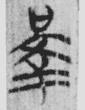{口幸}（梏）
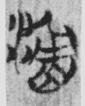{沈臼}（沉）
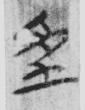{爫卩土}（抑）
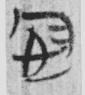念
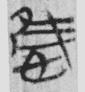惟
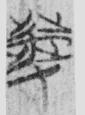癹（發）
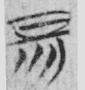昜（揚）
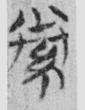絭（騰）
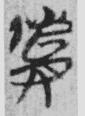{人𡴎貝}（𥌚）
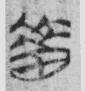昔
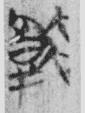○（融）
